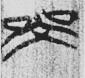○（鄰）
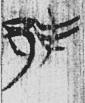邦
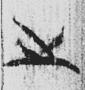之
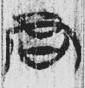君
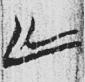亡
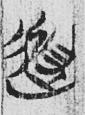道
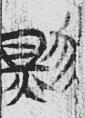則
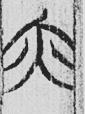亦
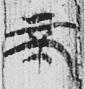不
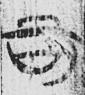可
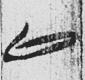㠯
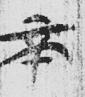不
